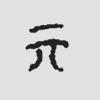亓（其）
